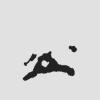五
